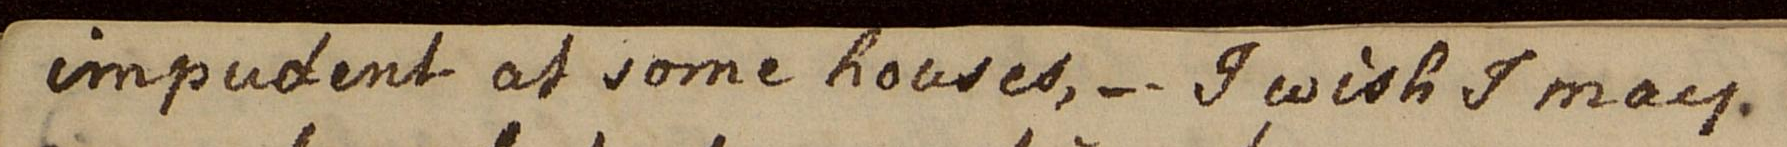impudent at some houses,- I wish I may.
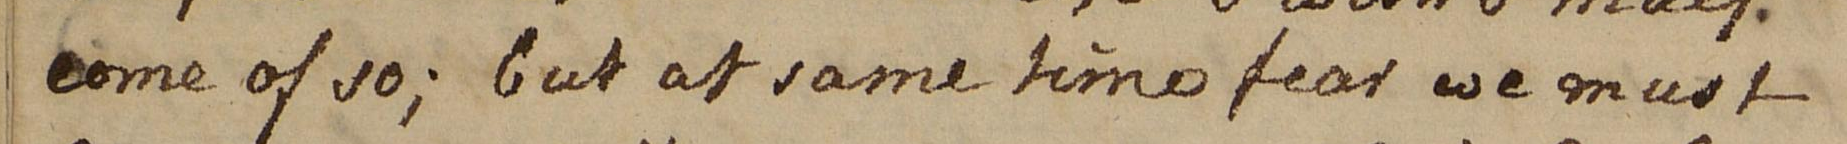come of so; but at same time fear we must
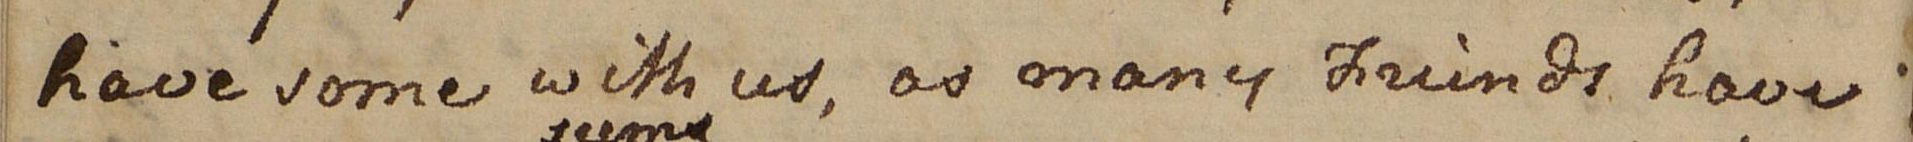have some with us, as many Freinds have
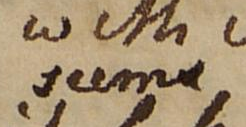seems
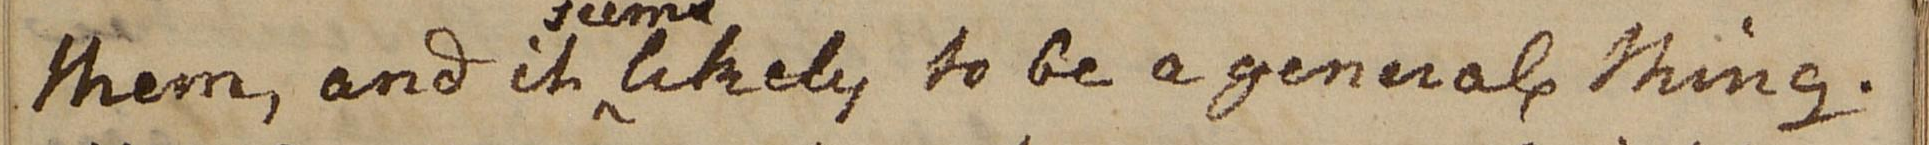them, and it ^ likely to be a general thing.
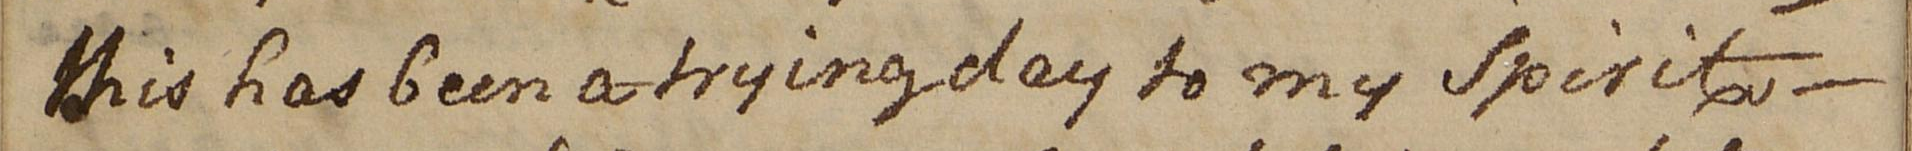this has been a trying day to my Spirit-
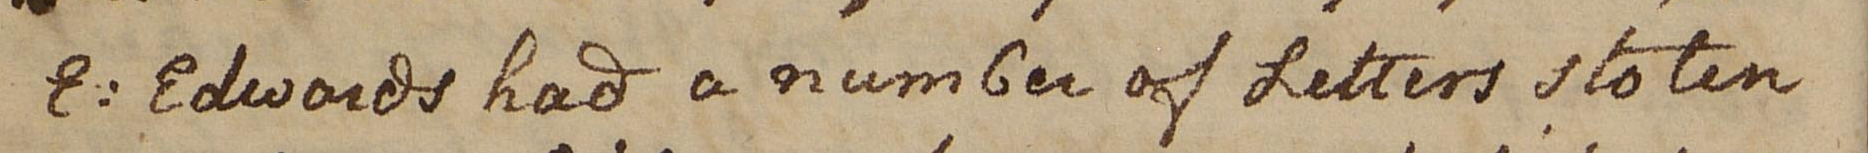E: Edwards had a number of Letters stolen
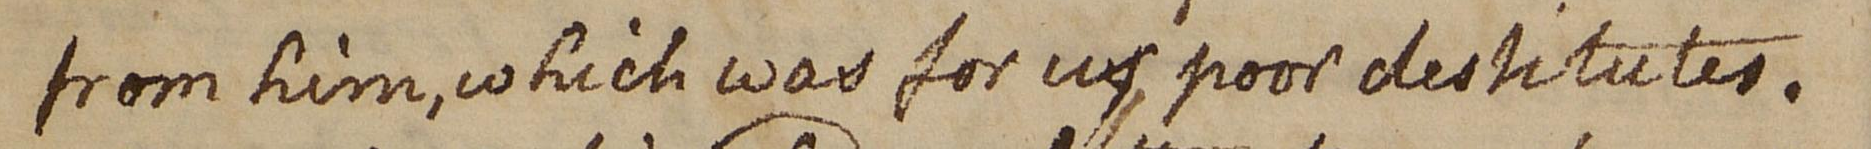from him, which was for us poor destitutes.
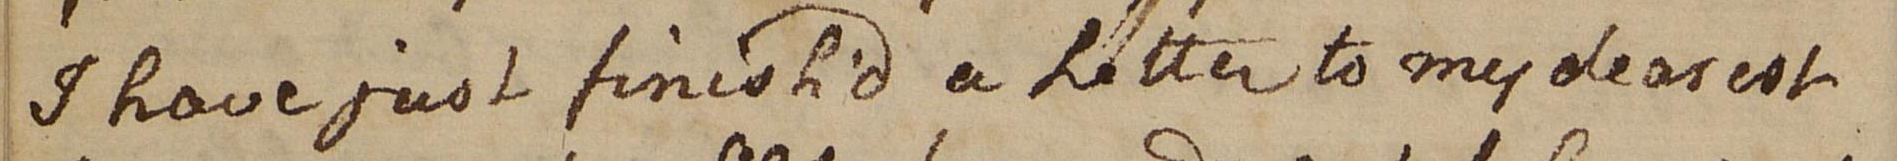I have just finish'd a Letter to my dearest
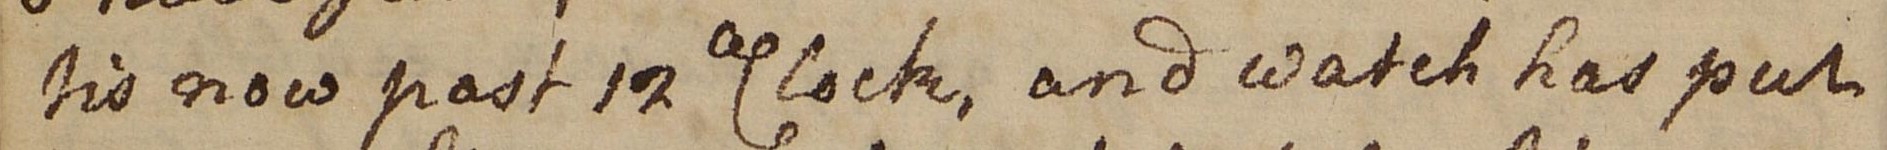tis now past 12 ^oClock, and watch has put
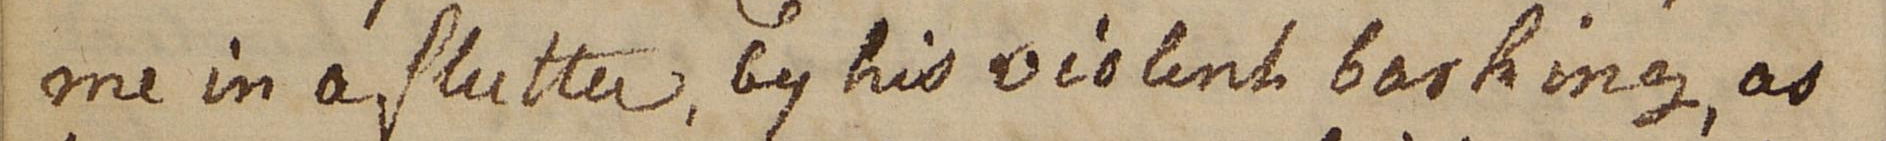me in a flutter, by his violent barking, as
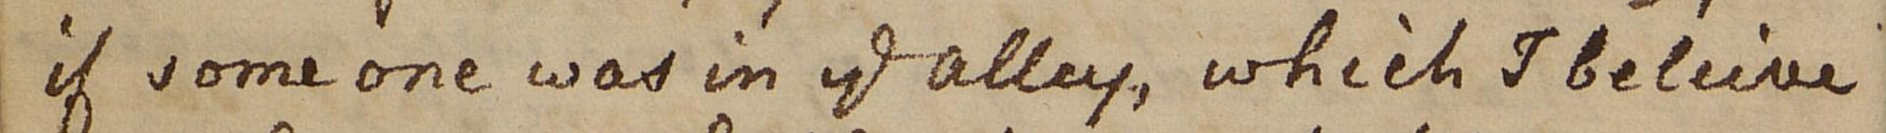if some one was in y^e alley, which I beleive
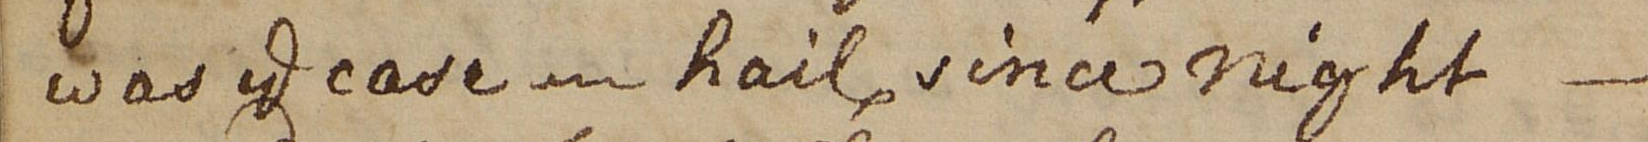was y^e case - hail since night-
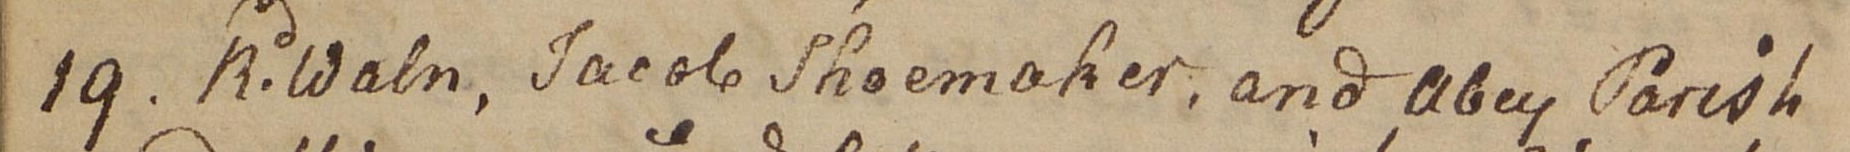19. R^d. Waln, Jacob Shoemaker, and Abey Parish
